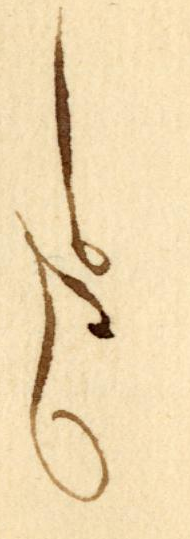To
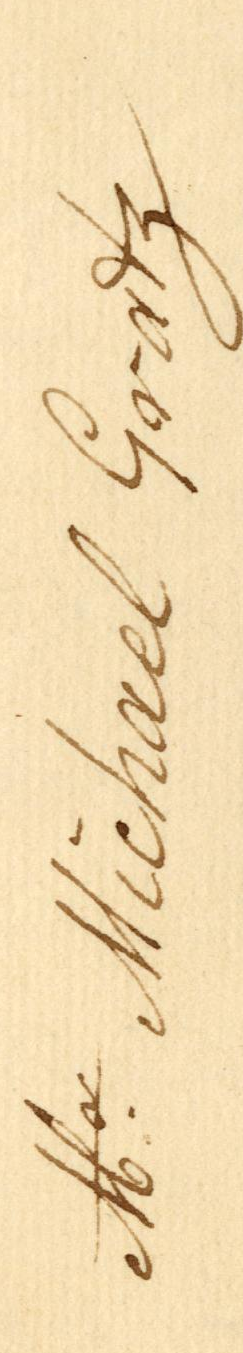M^r Michael Gratz
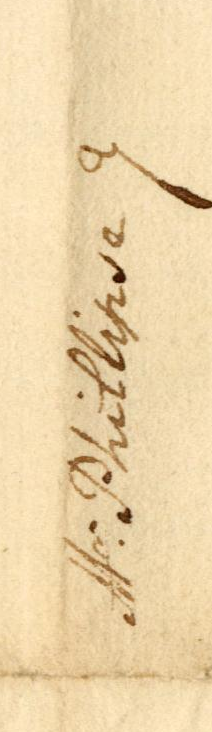M^r Phillipse
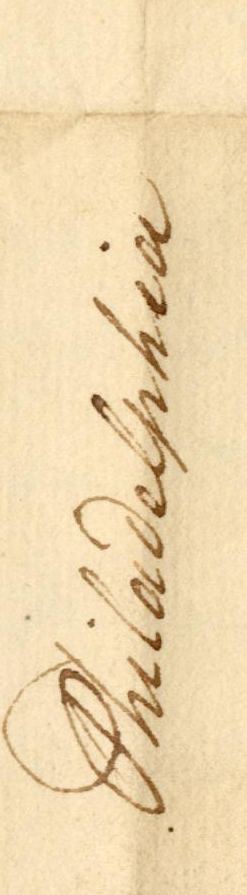Philadelphia
